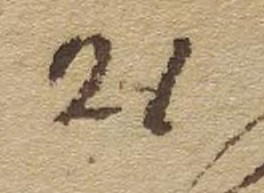21
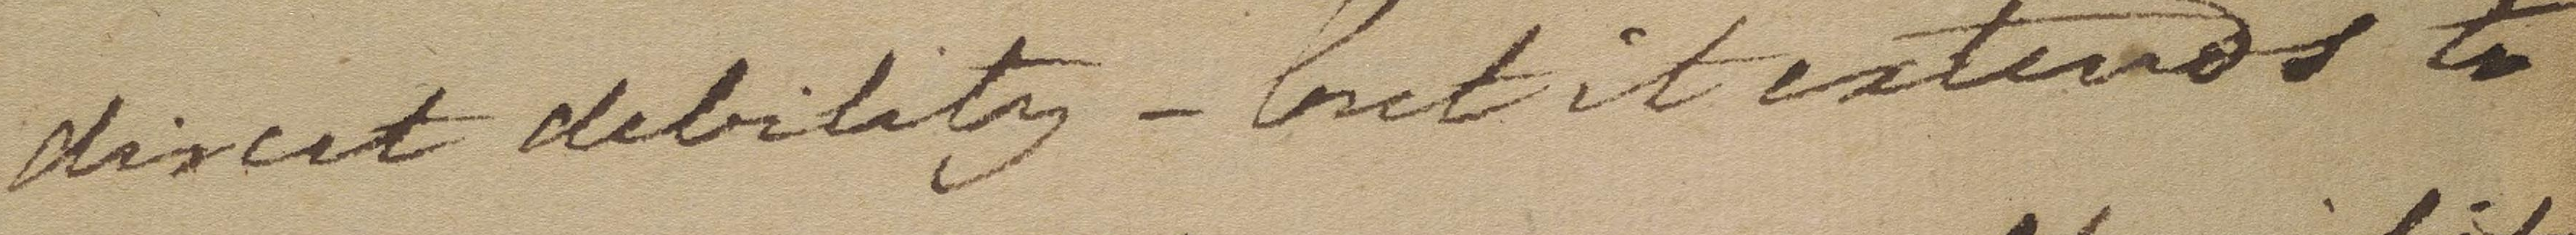direct debility, but it extends to
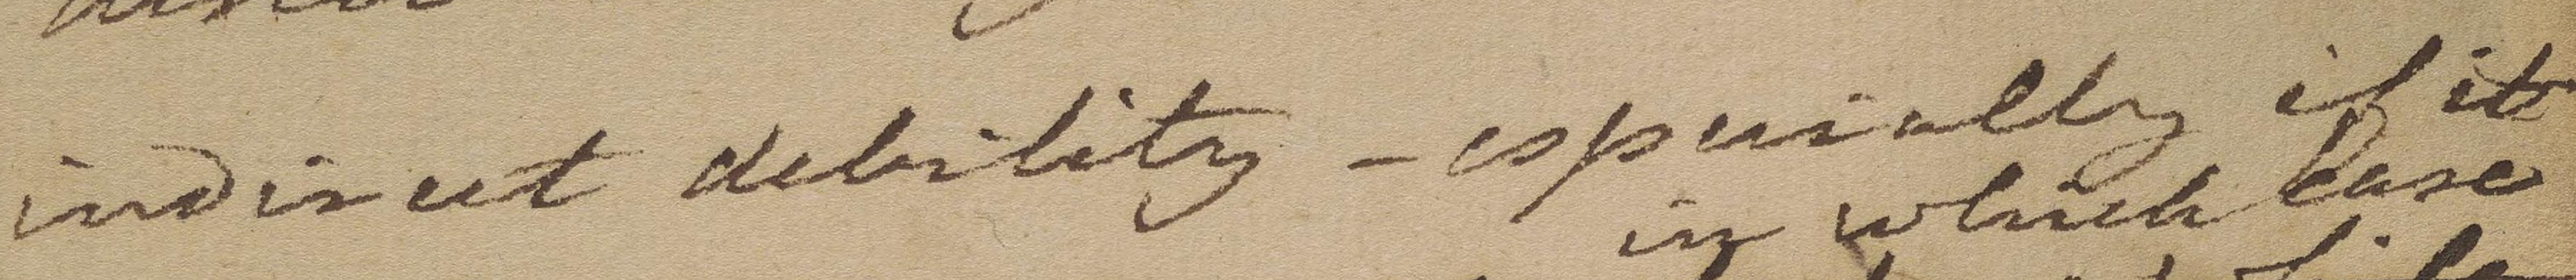indirect debility- especially if it
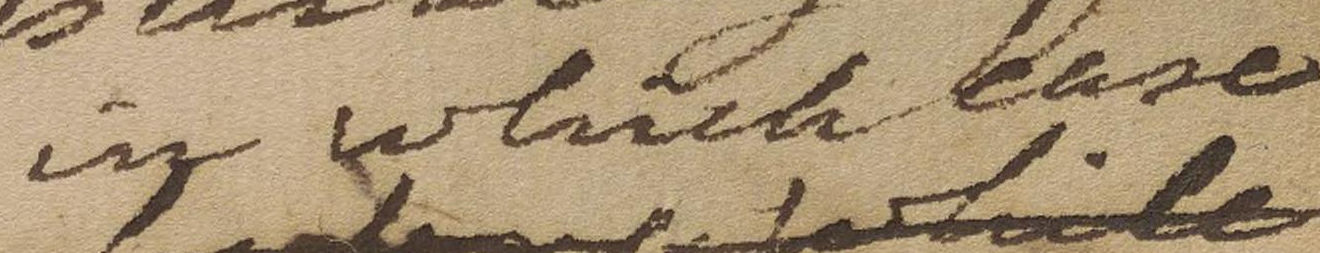in which case
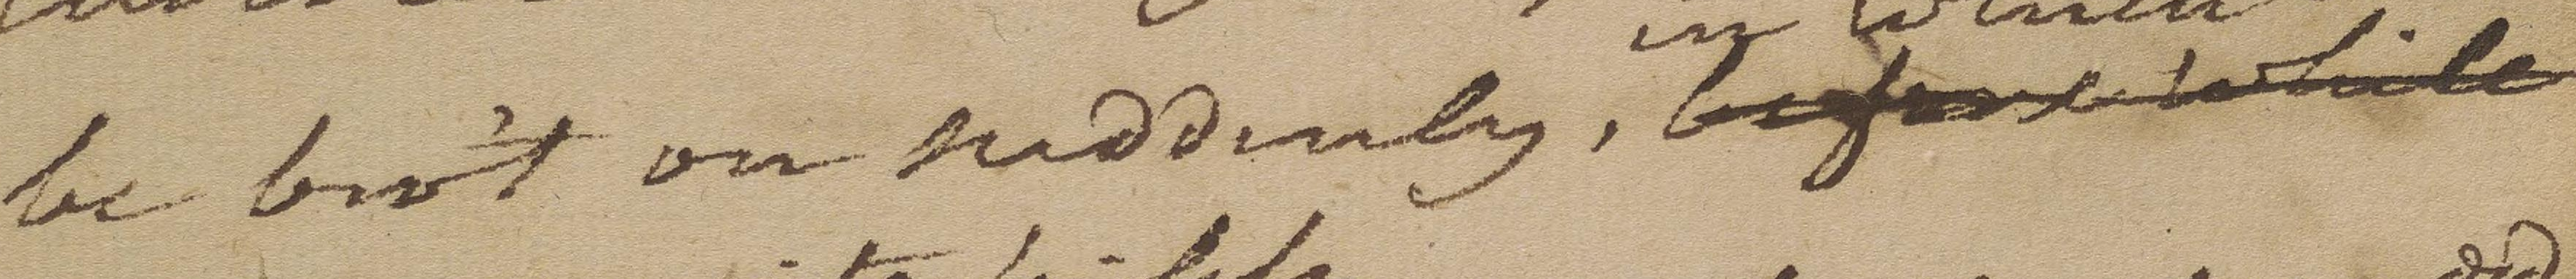be bro't on suddenly, [before which]
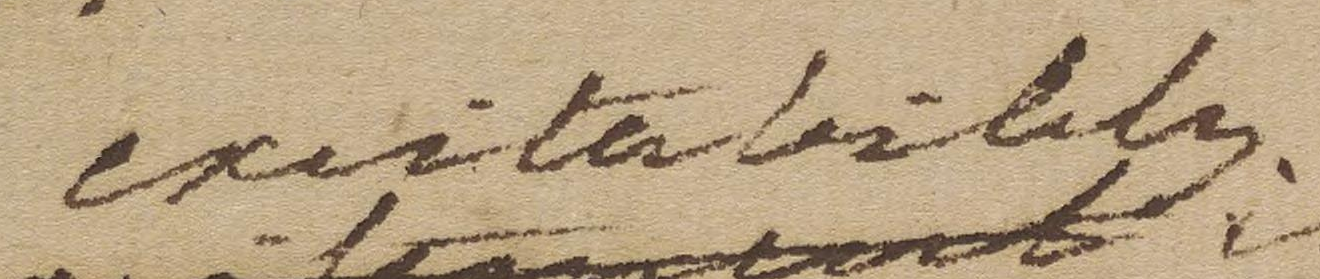excitability
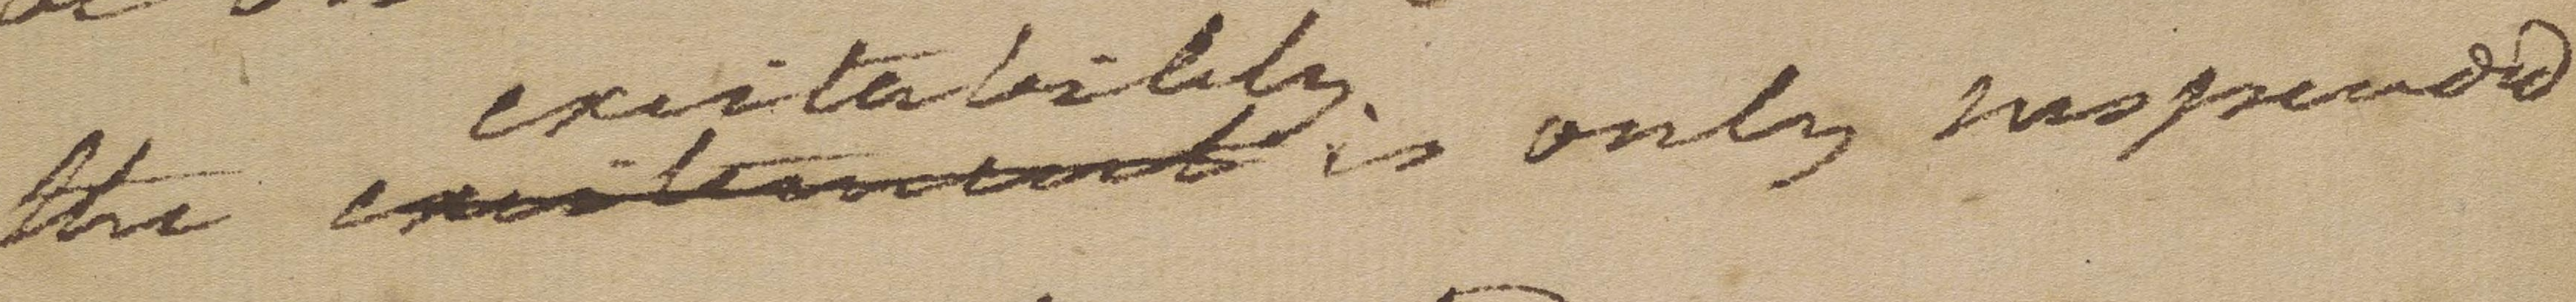the [excitement] is only suspended
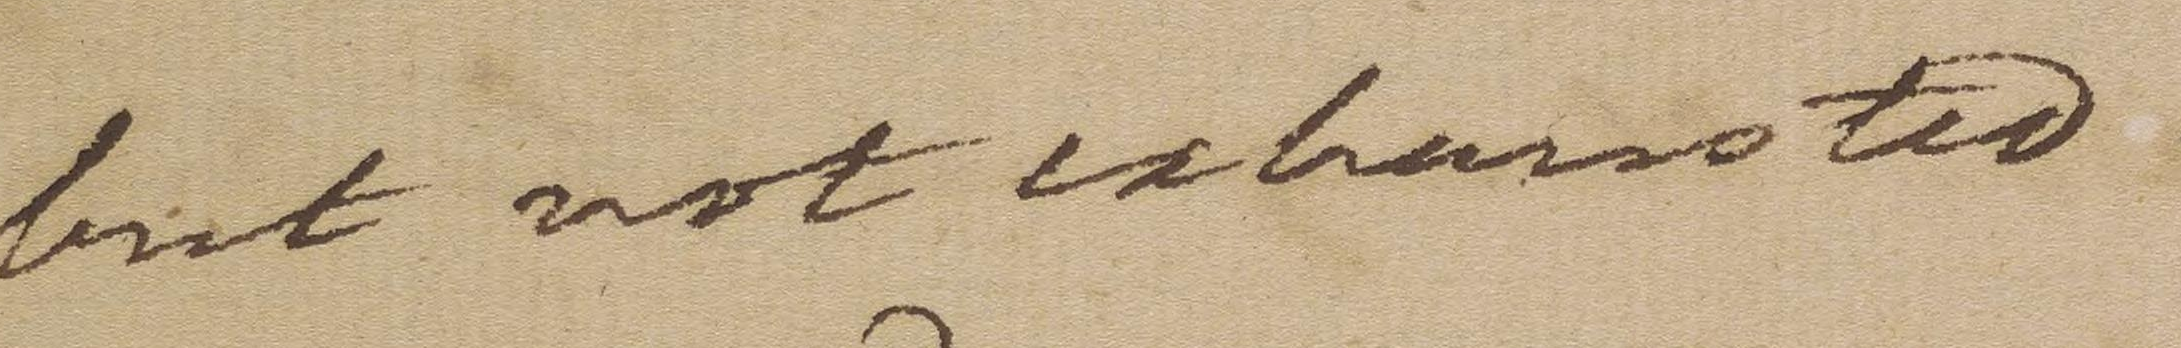but not exhausted.
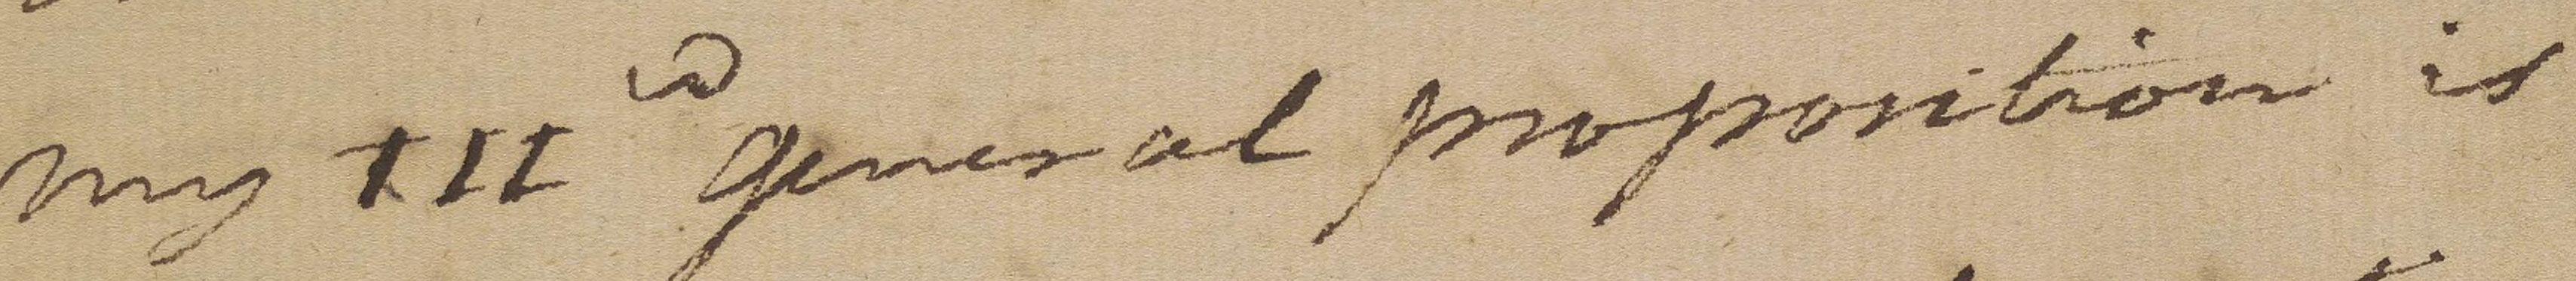My III^rd general proposition is
